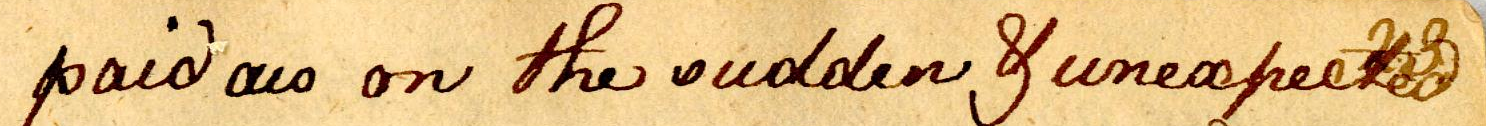paid ous on the sudden & unexpected
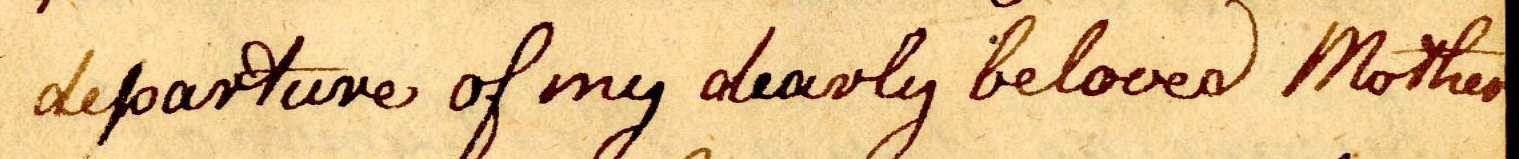departure of my dearly beloved Mother
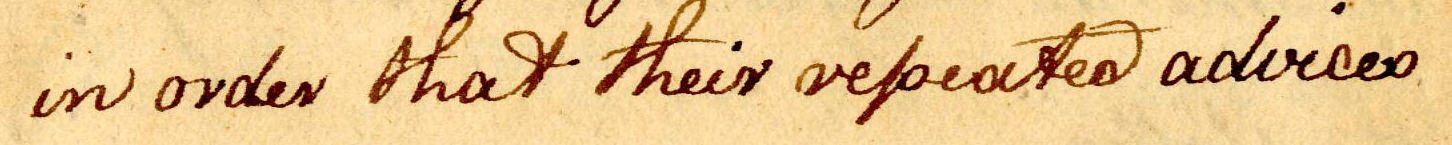in order that their repeated advices
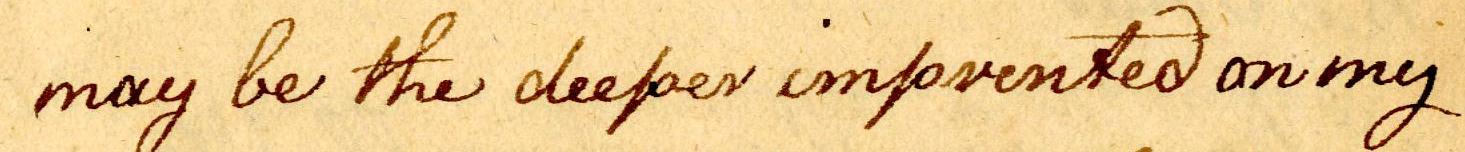may be the deeper imprented on my
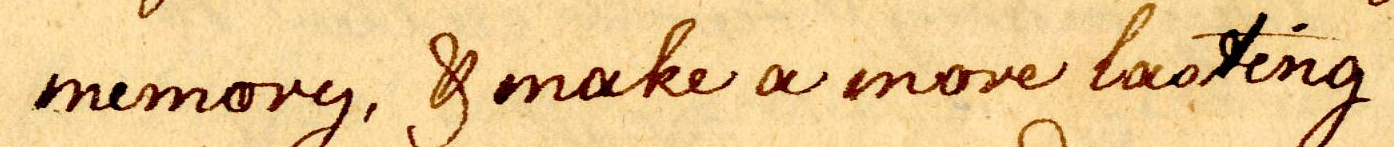memory, & make a more lasting
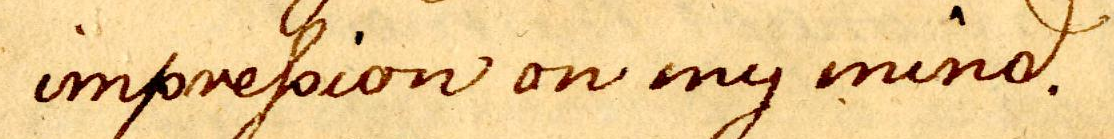impression on my mind.
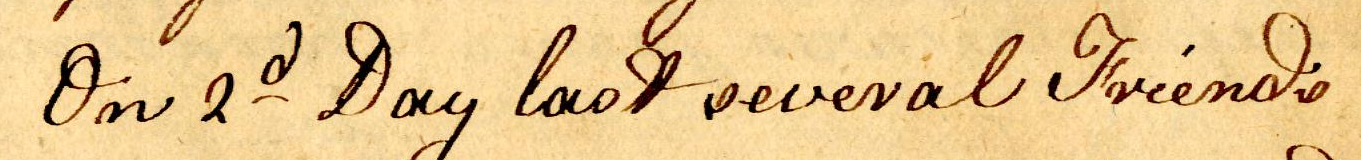On 2^d Day last several Friends
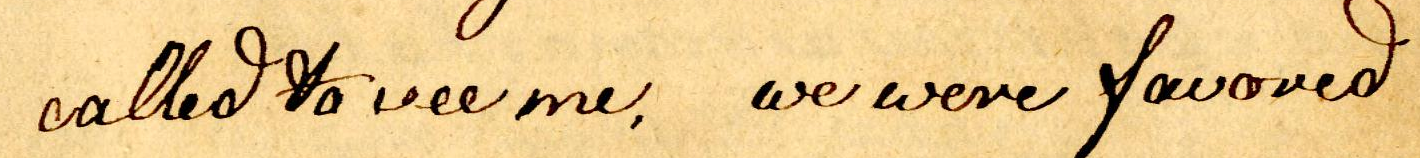called to see me, we were favored
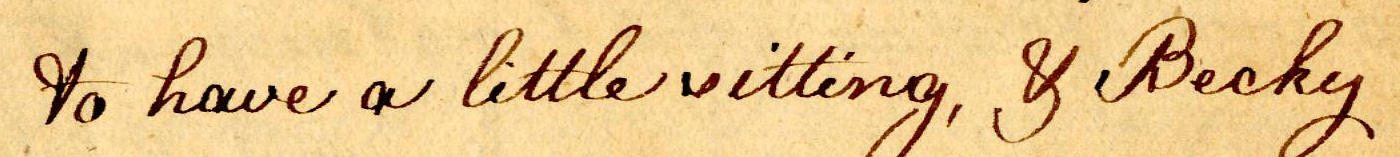to have a little sitting, & Becky
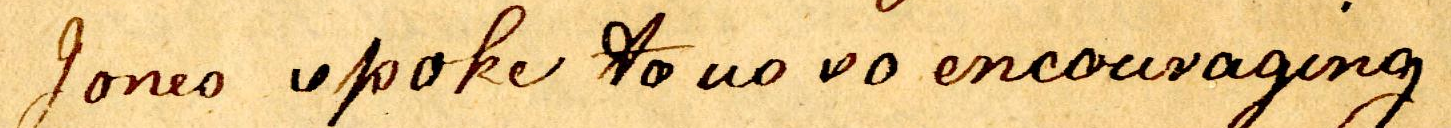Jones spoke to us so encouraging
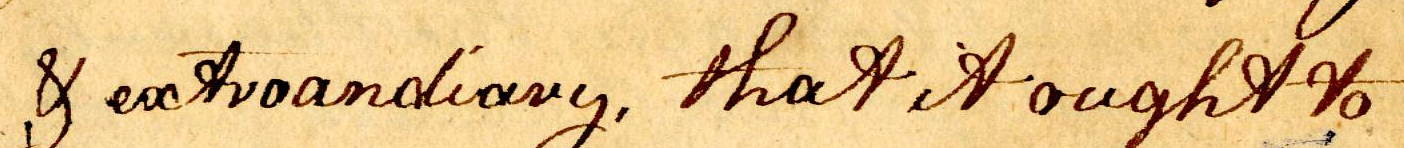& extroandiary, that it ought to
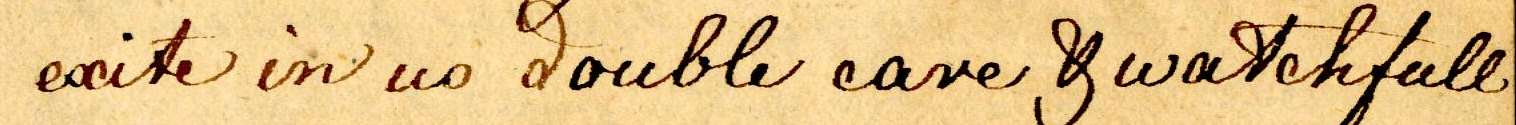excite in us double care & watchfull
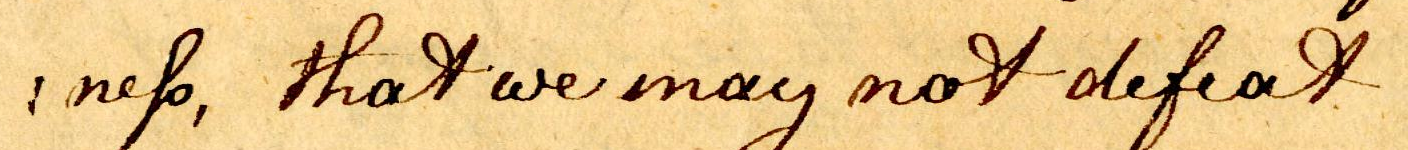-ness, that we may not defeat
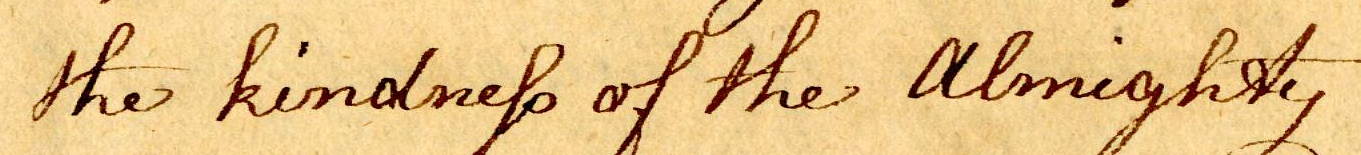the kindness of the Almighty
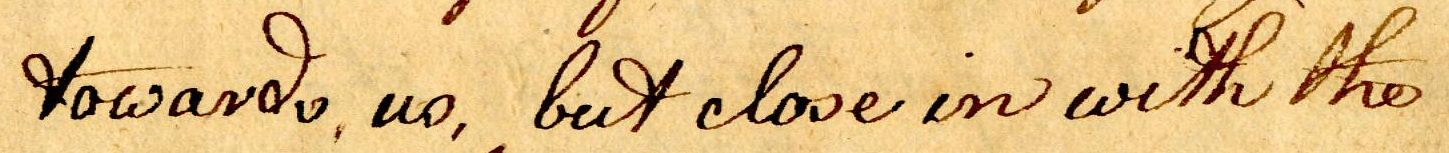towards us, but close in with the
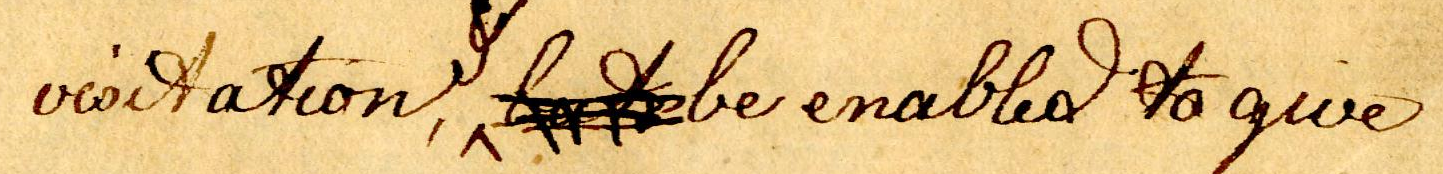visitation, ^& [____] be enabled to give
